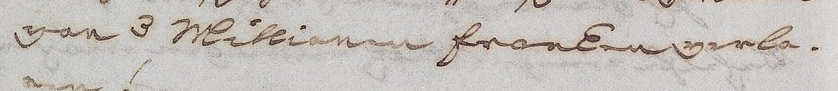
von 3 Millionen Franken verlo-
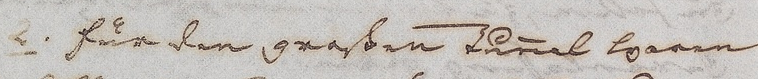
2. Für den großen Tunnel waren
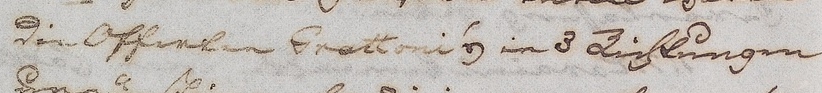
die Offerten Grattoni's in 3 Richtungen
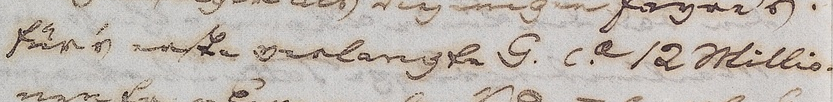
Für's erste verlangte G. ca 12 Millio-
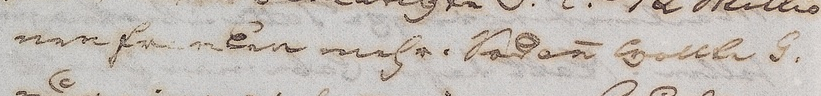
nen Franken mehr. Sodann wollte G.
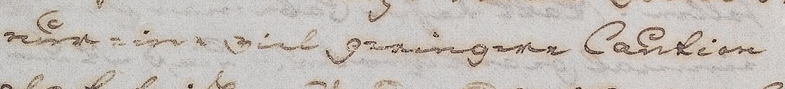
nur eine viel geringere Caution
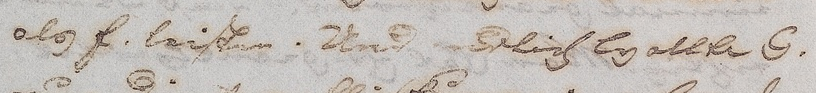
als F. leisten. Und endlich wollte G.
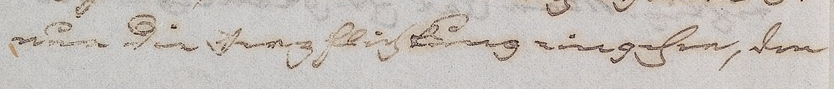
nur die Verpflichtung eingehen, den
